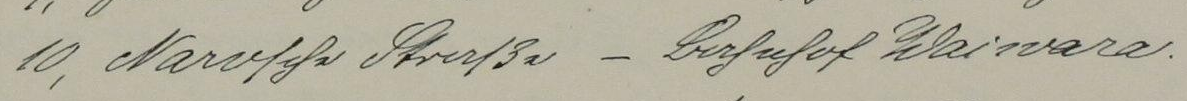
10. Narvsche Straße-Bahnhof Waiwara.
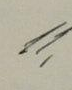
11.
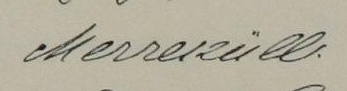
Merreküll.
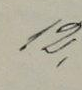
12.
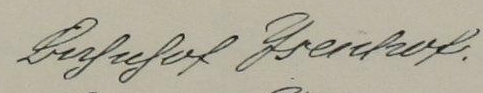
Bahnhof Isenhof.
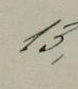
13.
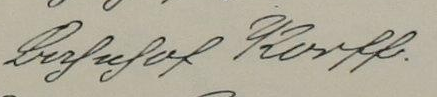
Bahnhof Korff.
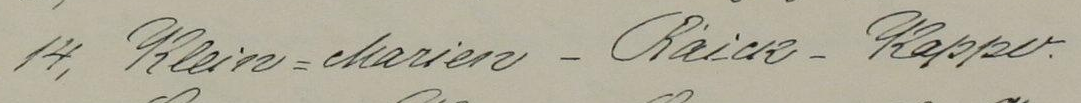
14. Klein-Marien–Raick–Kappo.
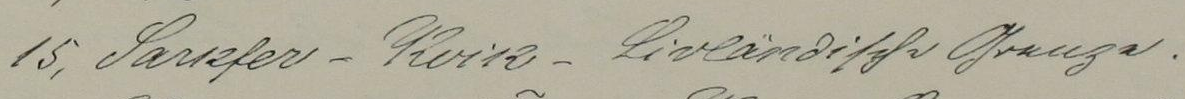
15. Sarkfer-Koik-Livländische Grenze.
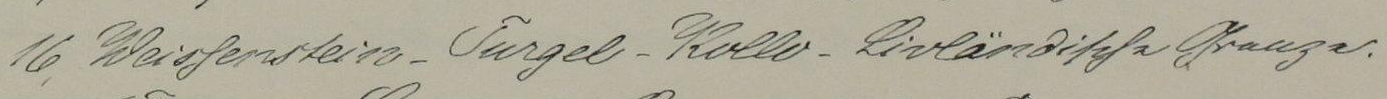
16. Weissenstein-Turgel-Kollo-Livländische Grenze.
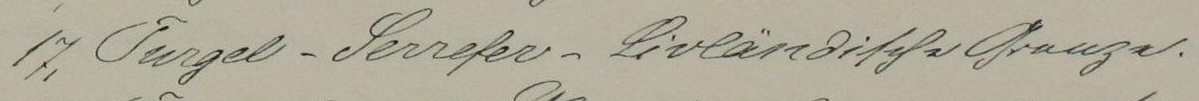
17. Turgel-Serrefer-Livländische Grenze.
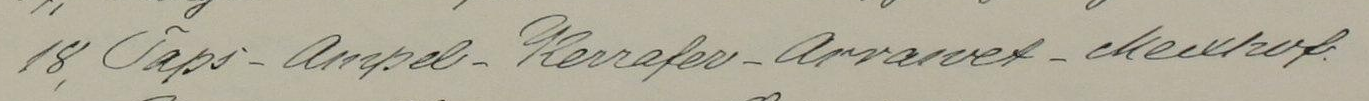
18. Taps-Ampel-Kerrafer-Arrawet-Mexhof.
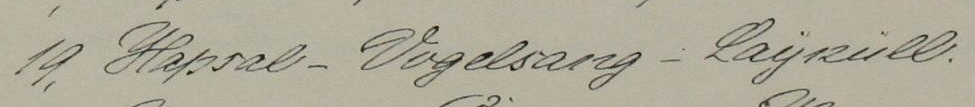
19. Hapsal-Vogelsang-Layküll.
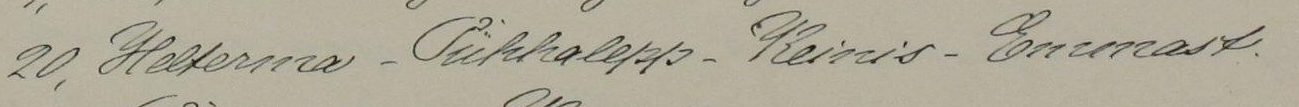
20. Helterma-Pühhalepp-Keinis-Emmast.
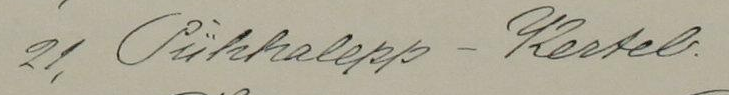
21. Pühhalepp-Kertel.
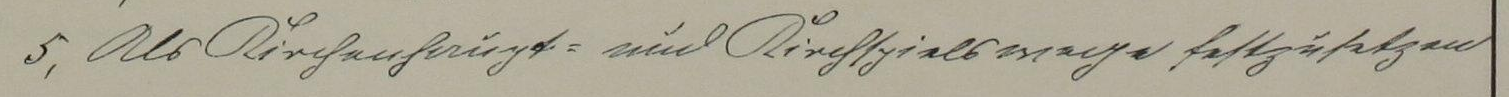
5. Als Kirchenhaupt- und Kirchspielswege festzusetzen
